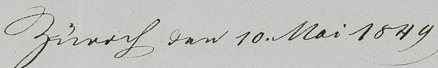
Zürich den 10. Mai 1849.
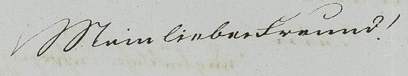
Mein lieber Freund!
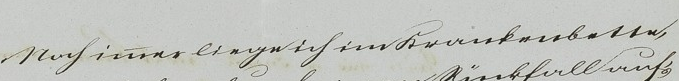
Noch immer liege ich im Krankenbette,
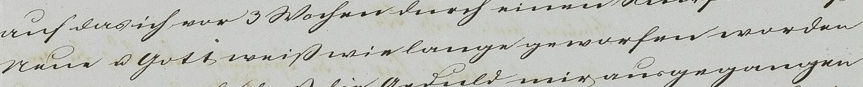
Neue & Gott weiß wie lange geworfen worden
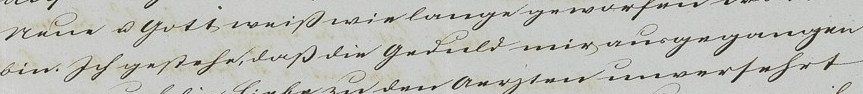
bin. Ich gestehe, daß die Geduld mir ausgegangen
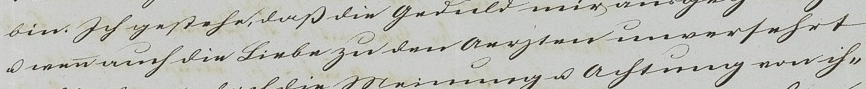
& wenn auch die Liebe zu den Aerzten unversehrt
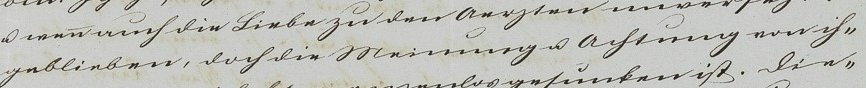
geblieben, doch die Meinung & Achtung vor ih-
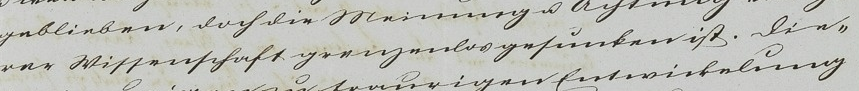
rer Wissenschaft grenzenlos gesunken ist. Die-
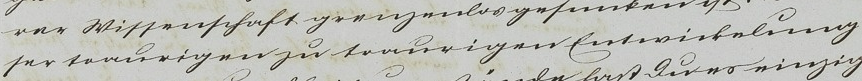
ser traurigen zu traurigen Entwickelung
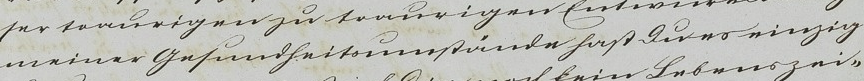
meiner Gesundheitsumstände hast Du es einzig
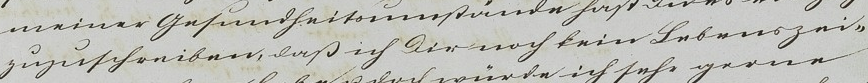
zuzuschreiben, daß ich Dir noch kein Lebenszei-
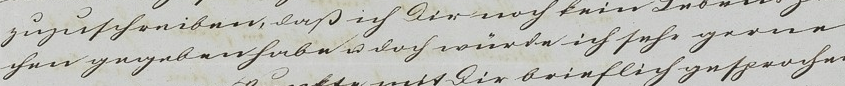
chen gegeben habe & doch würde ich sehr gerne
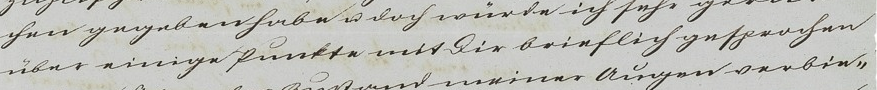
über einige Punkte mit Dir brieflich gesprochen
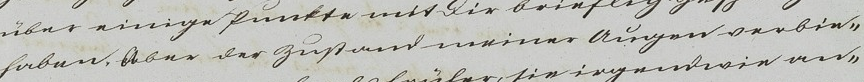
haben. Aber der Zustand meiner Augen verbie-
